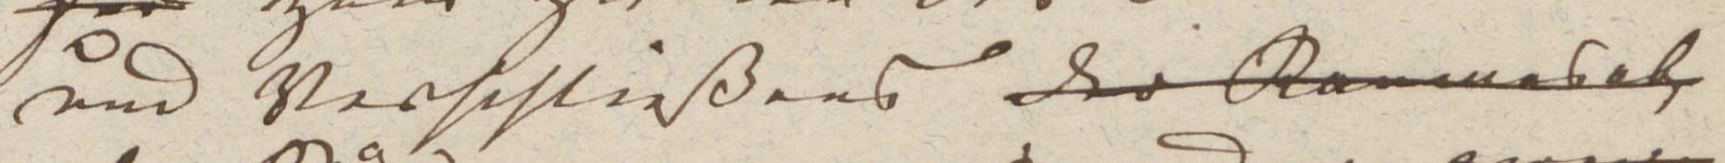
und Verschliessens der Raumesab
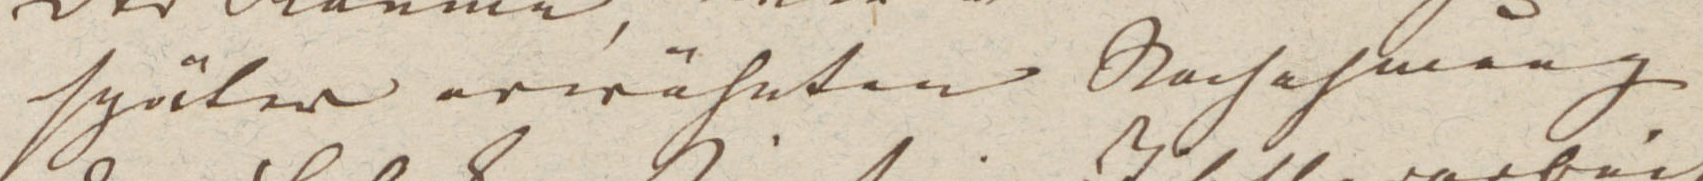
später erwähnten Nachahmung
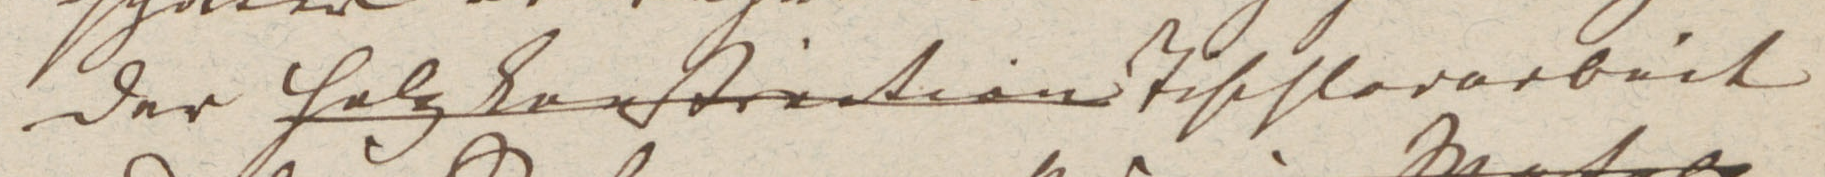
der Holzkonstruction Tischlerarbeit
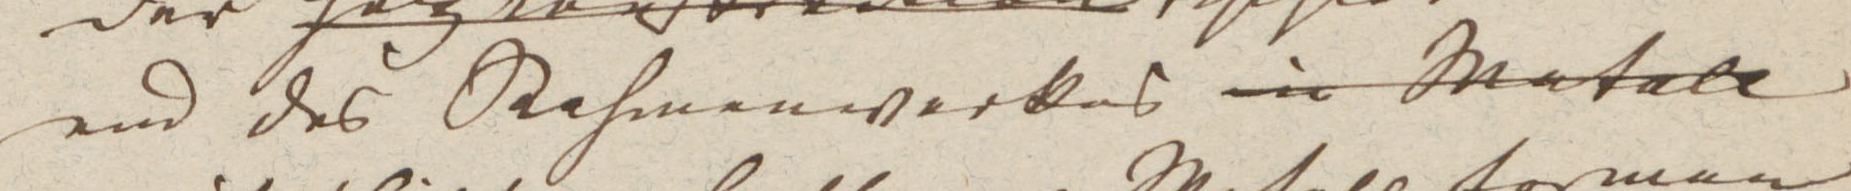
und des Rahmenwerkes in Metall
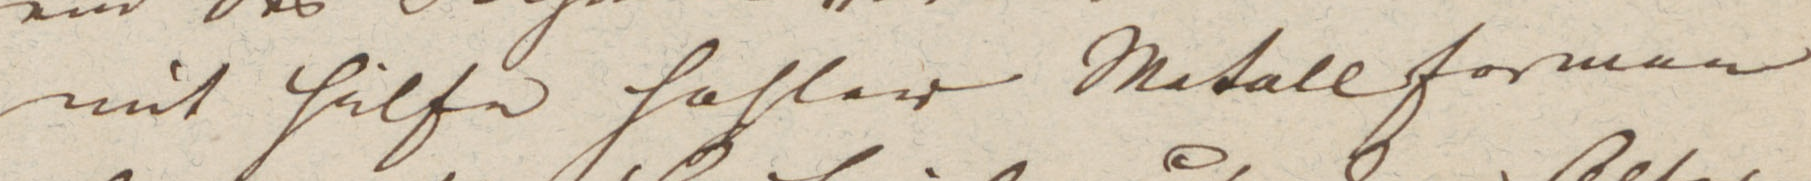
mit Hülfe hohler Metallformen
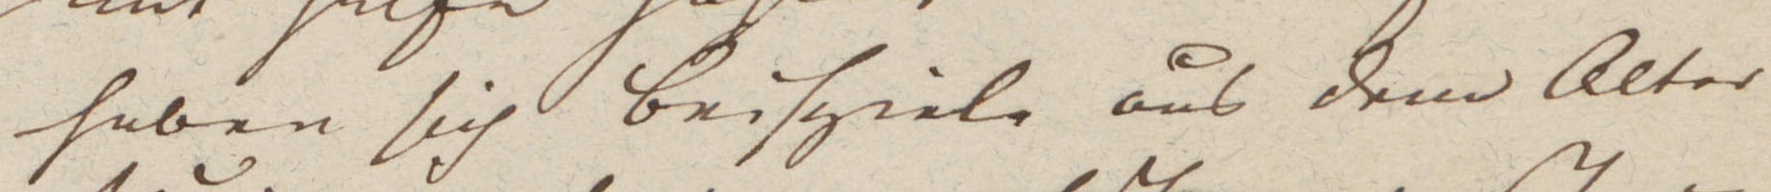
haben sich Beispiele aus dem Alter-
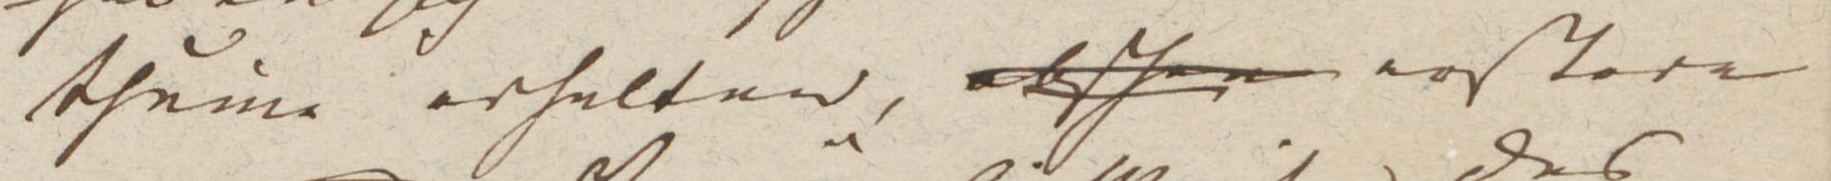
thume erhalten, obschon erstere
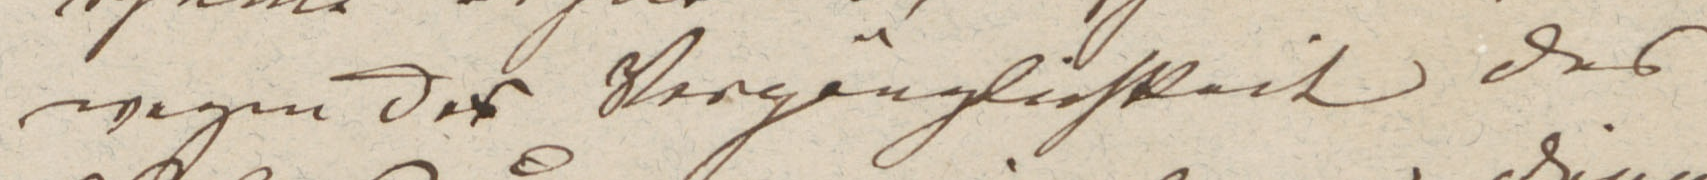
wegen desr Vergänglichkeit des
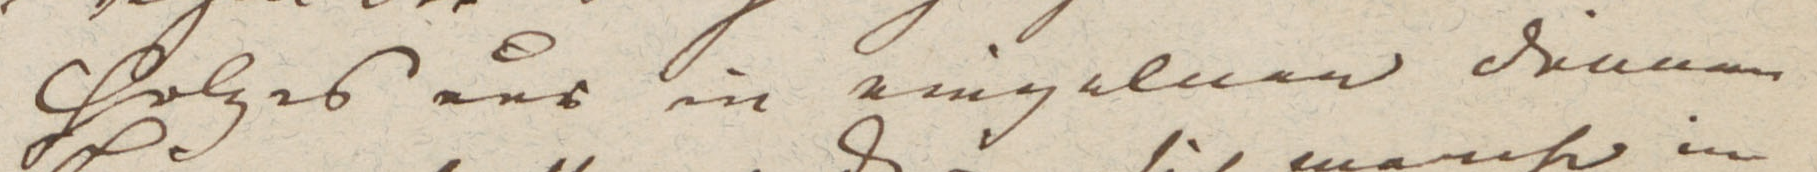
Holzes nur in einzelnen dünnen
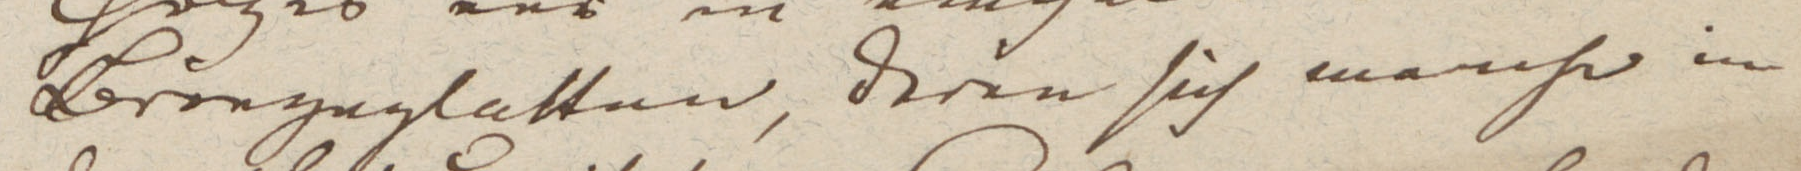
bBronzeplatten, deren sich manche in
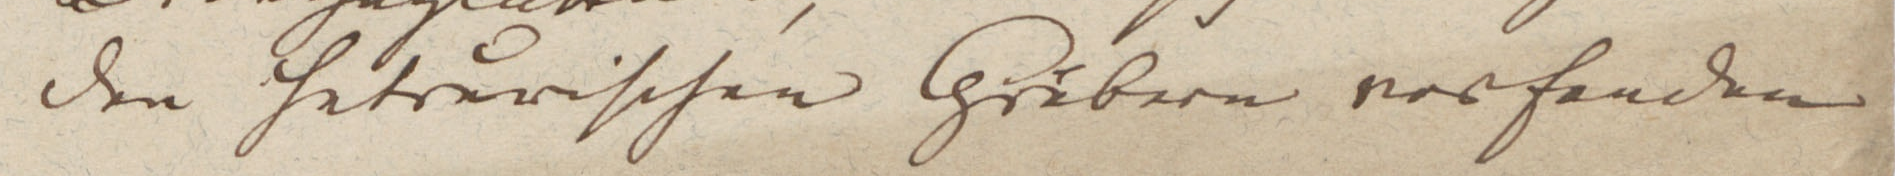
den Hetrurischen Gräbern vorfanden
